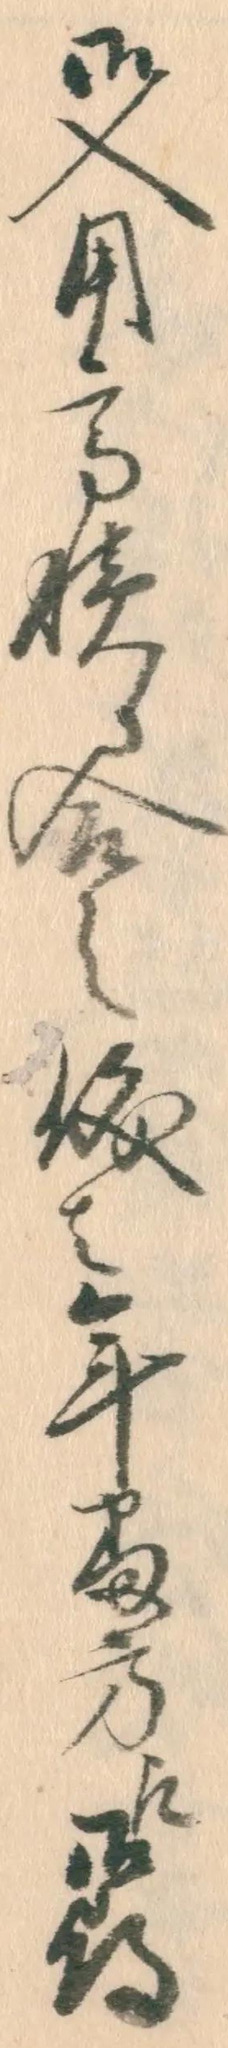御入用高積り合之儀は年番方え御尋
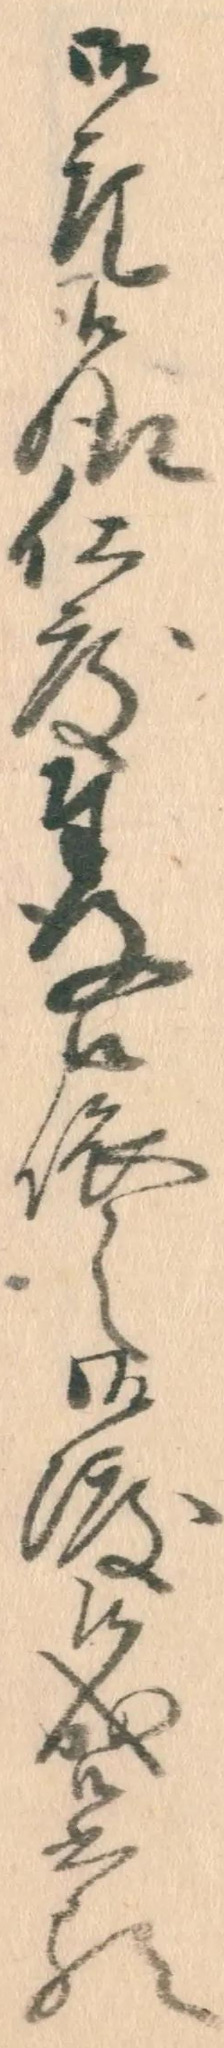御座候様仕度奉存候依之御渡被成書類
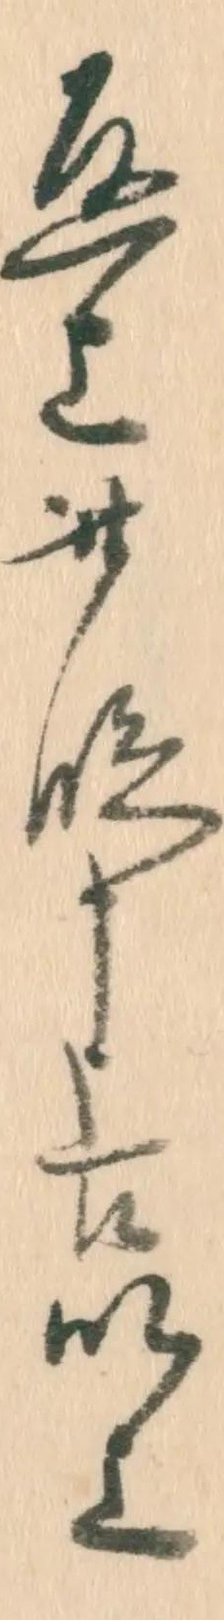返上此段申上候以上
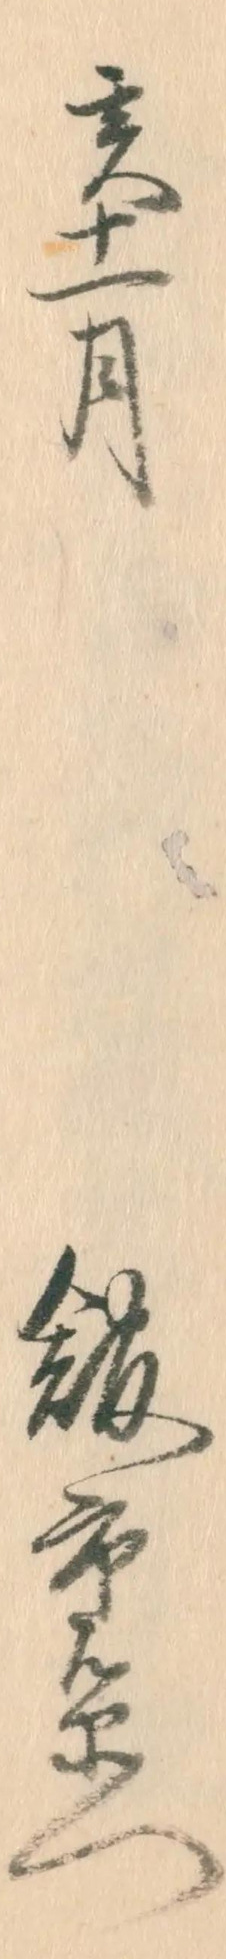亥十一月館市右衛門

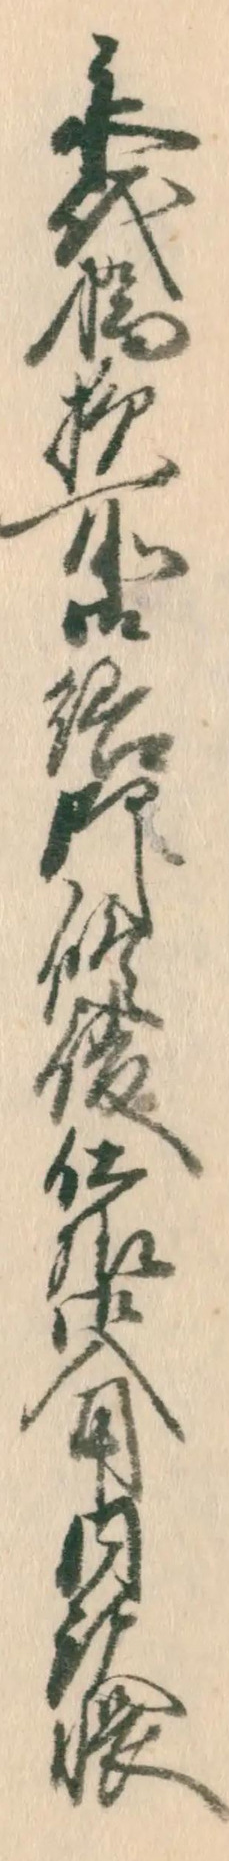永代橋損所御繕御修復仕様御入用内訳帳
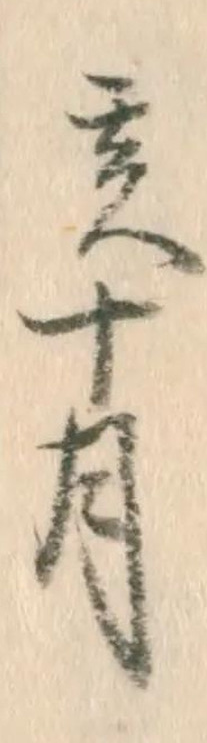亥十月
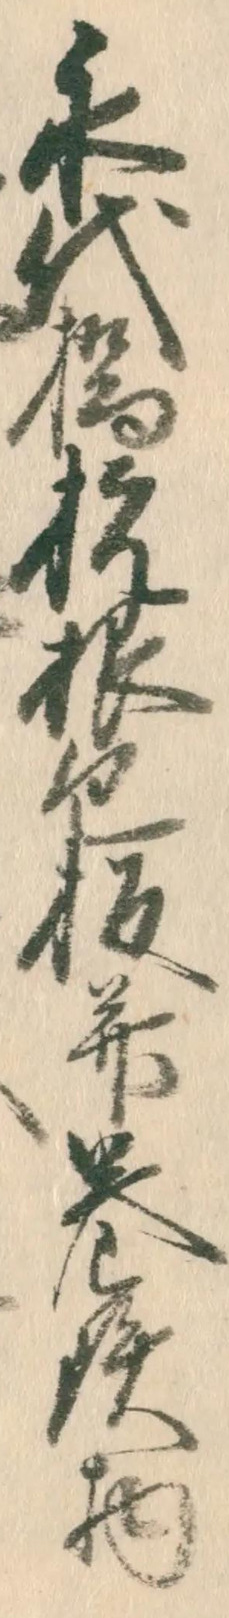永代橋杭根包板并巻鉄物
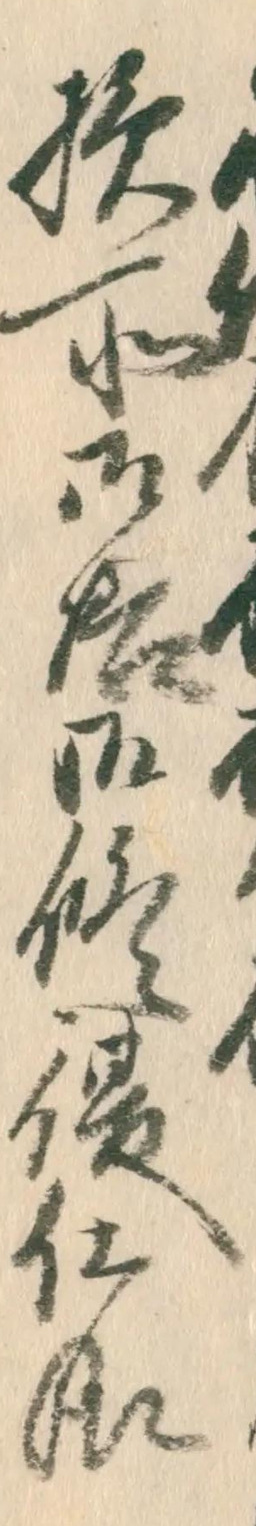損所御繕御修復仕様
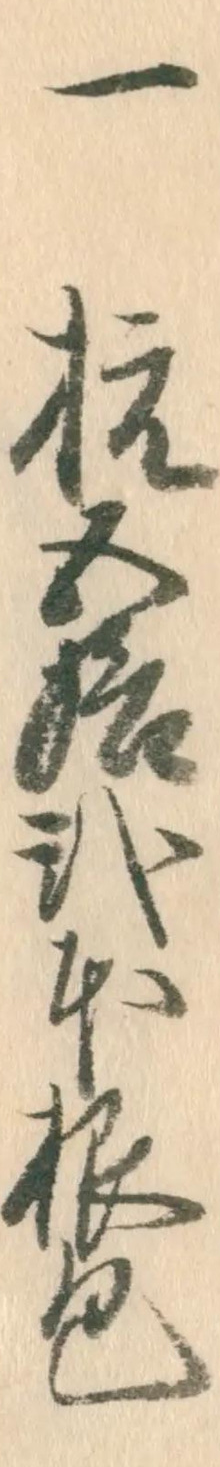一杭五拾弐本根包

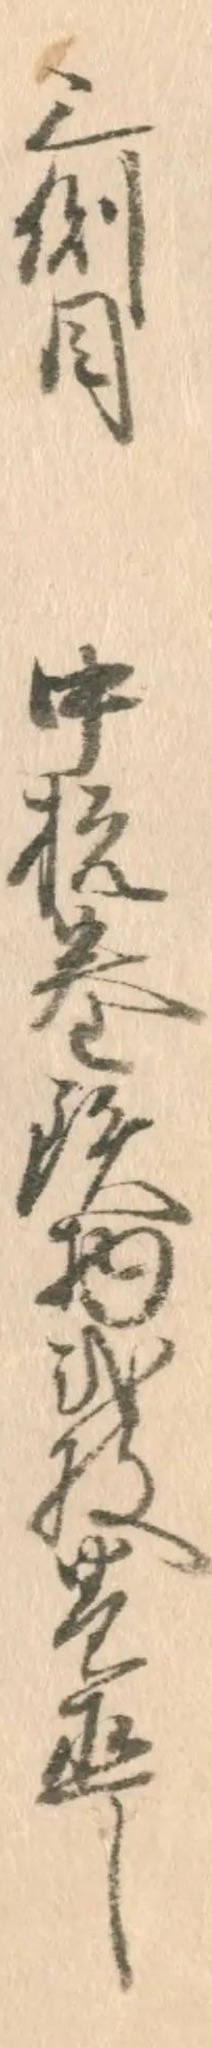三側目中杭巻鉄物弐枚巻直し
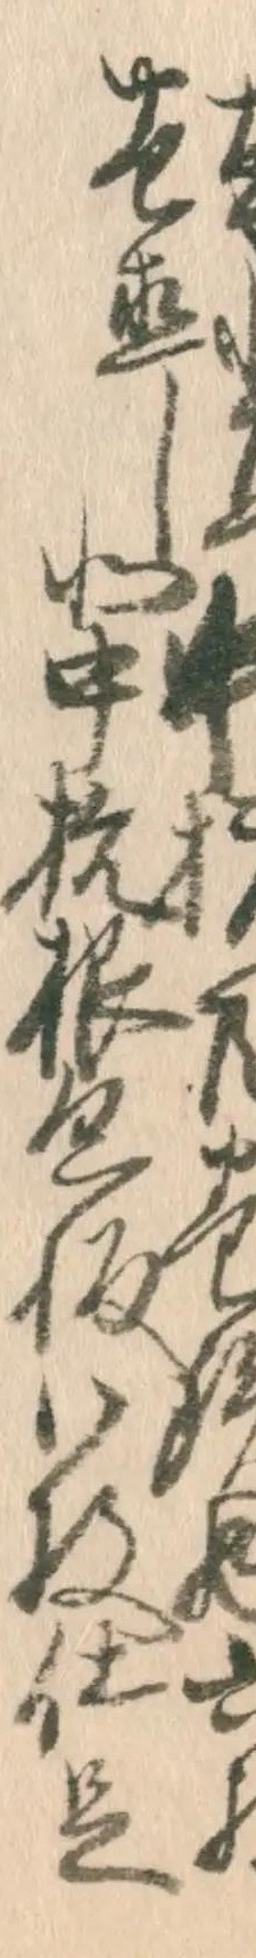巻直し北中杭根包板八枚仕足
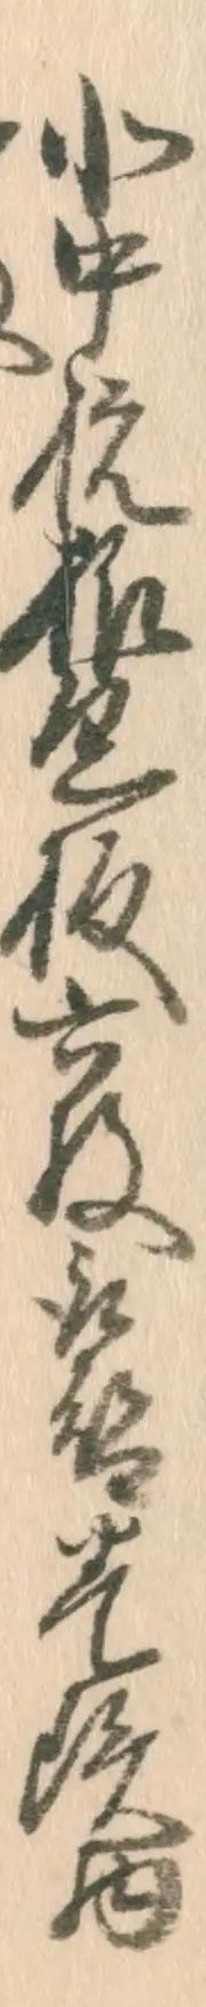五側目北中杭根包板六枚取替巻鉄物
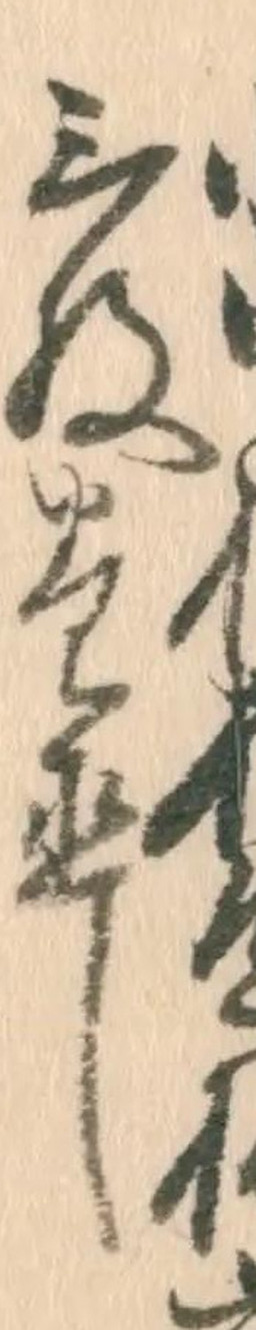三枚巻直し
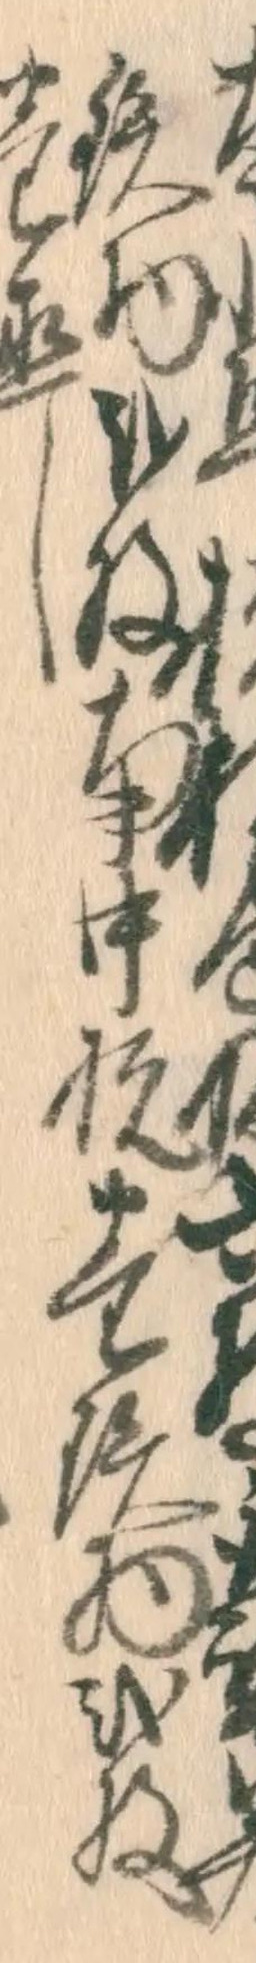鉄物弐枚南中杭巻鉄物弐枚
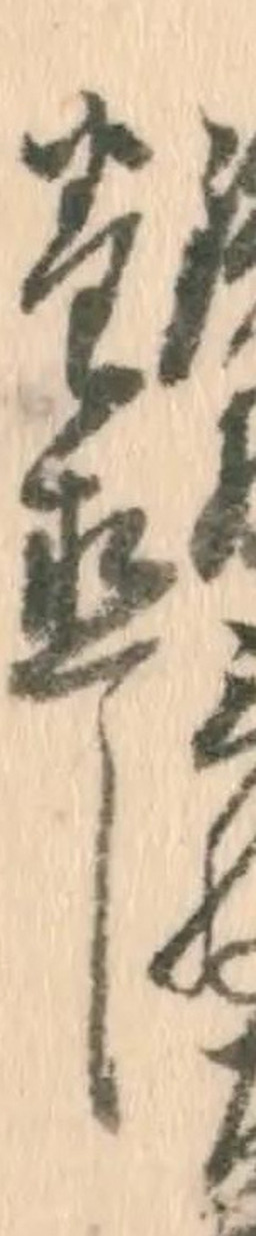巻直し
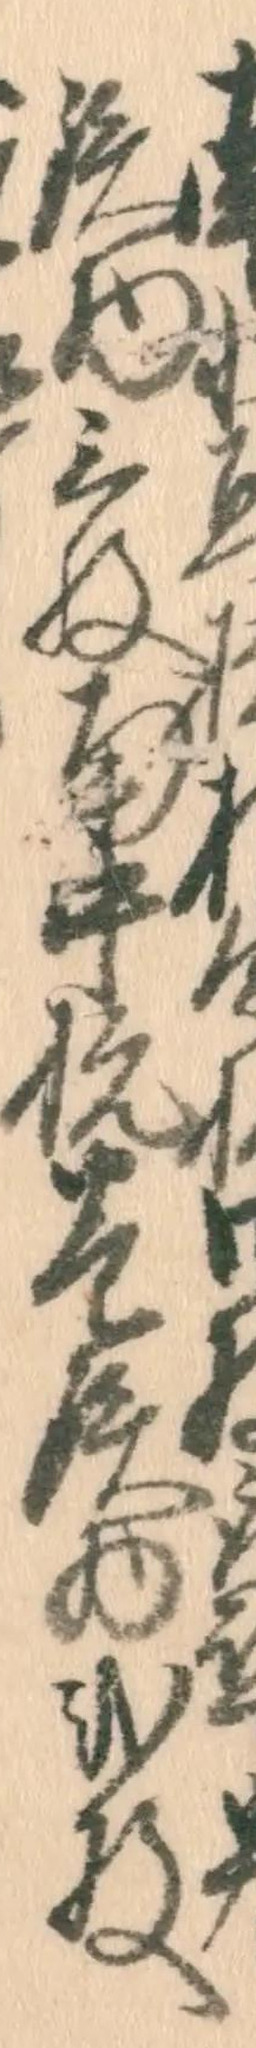鉄物三枚南中杭巻鉄物弐枚
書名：三橋 17巻. [7] 三橋小破御修復書留　但御奉行御掛リ替地震潰橋番屋　嘉永四亥年より安政二卯年迄　上
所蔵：国立国会図書館 National Diet Library, JAPAN
